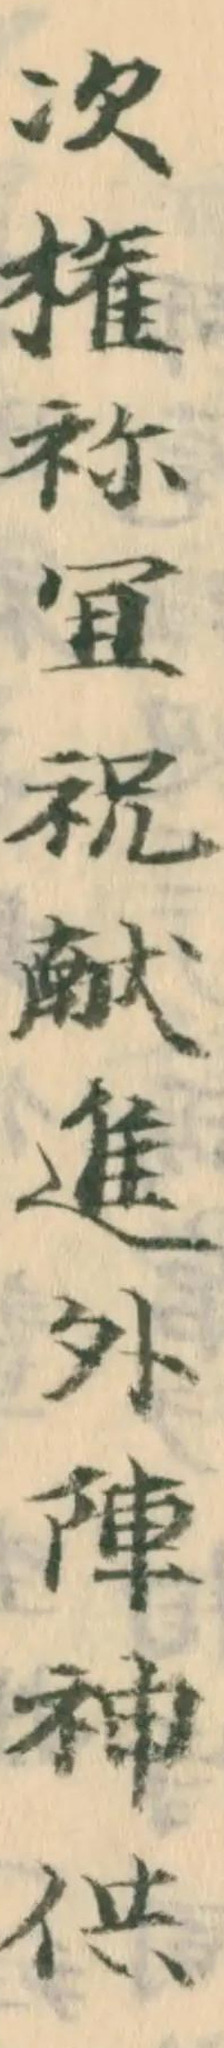次権禰宜祝献進外陣神供
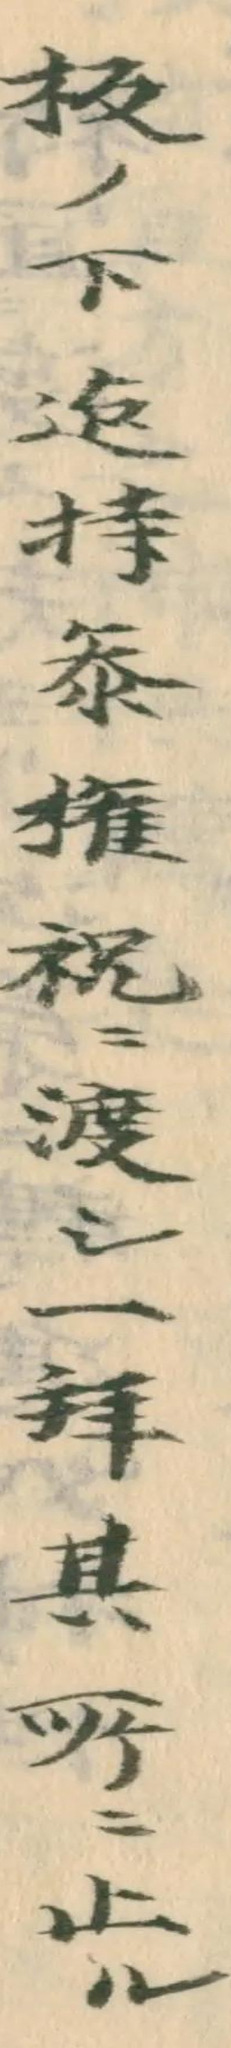板ノ下迄持参権祝ニ渡シ一拝其所ニ止ル
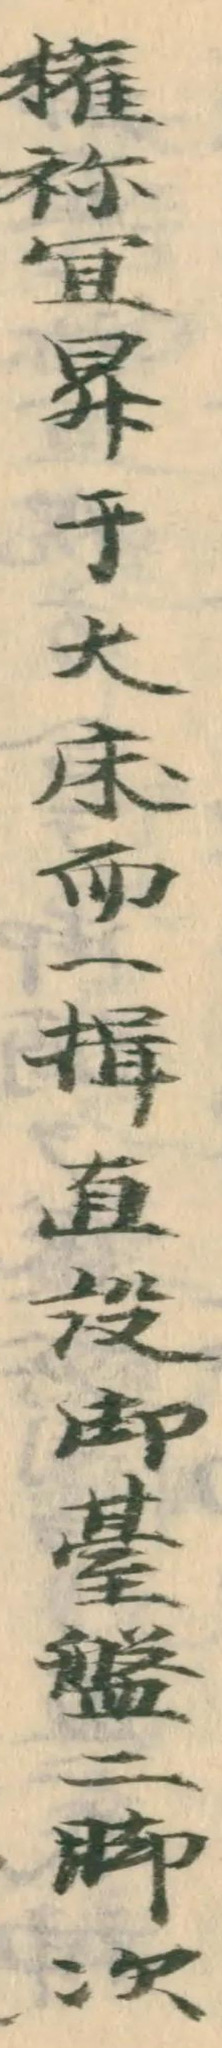権禰宜昇于大床而一揖直設御台盤二脚次
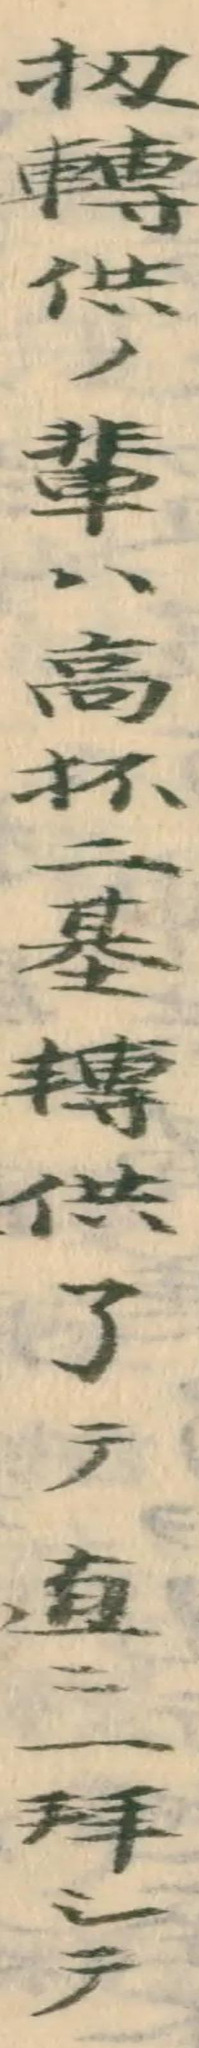扨転供ノ輩ハ高抔二基転供了テ直ニ一拝シテ
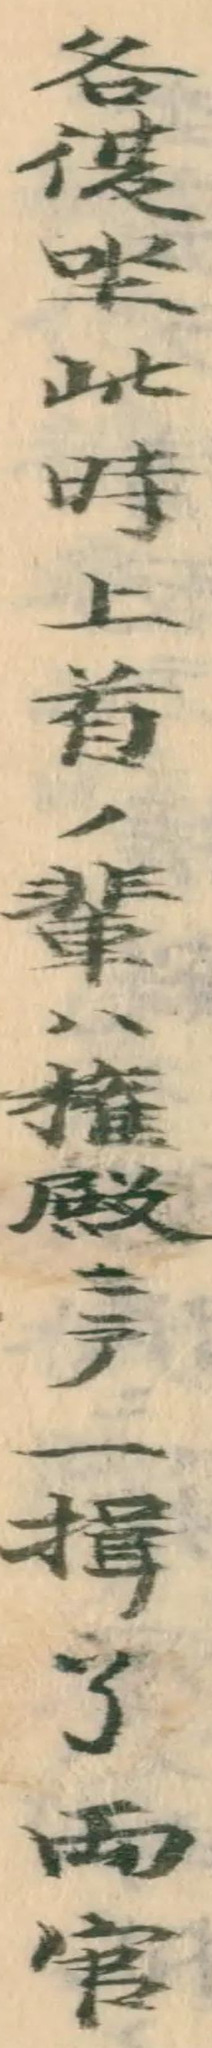各復坐此時上首ノ輩ハ権殿ニテ一揖了両官
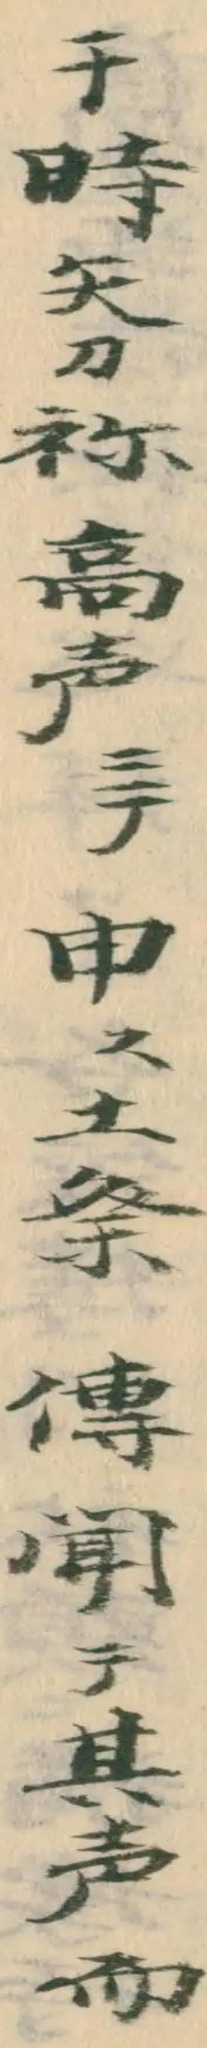于時矢刀禰高声ニテ申ス土祭伝聞テ其声而
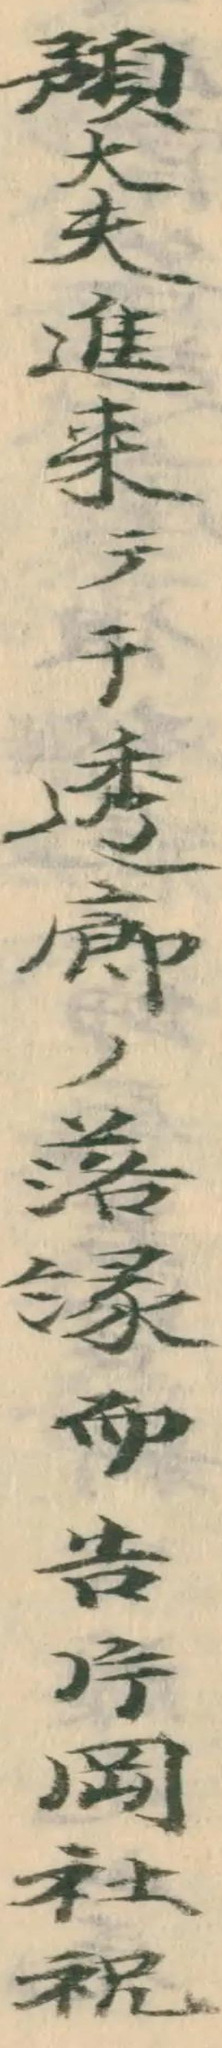預大夫進来テ于透廊ノ落縁而告片岡社祝
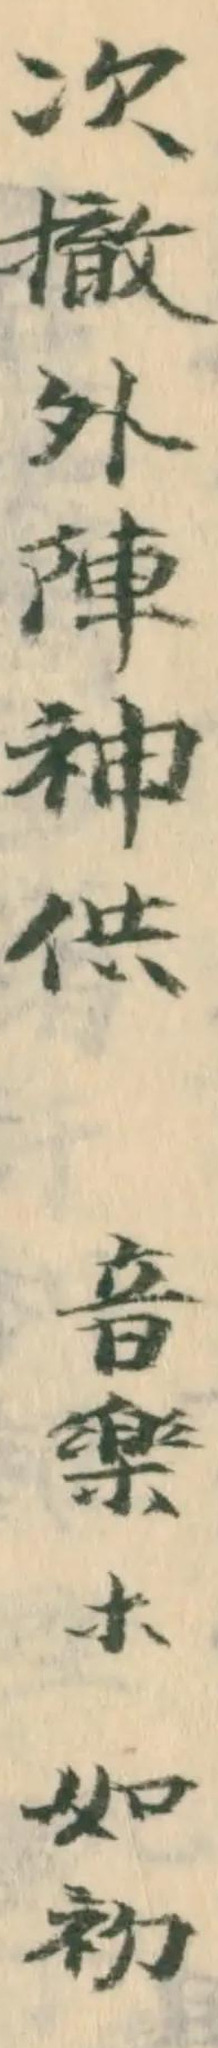次撤外陣神供音楽等如初
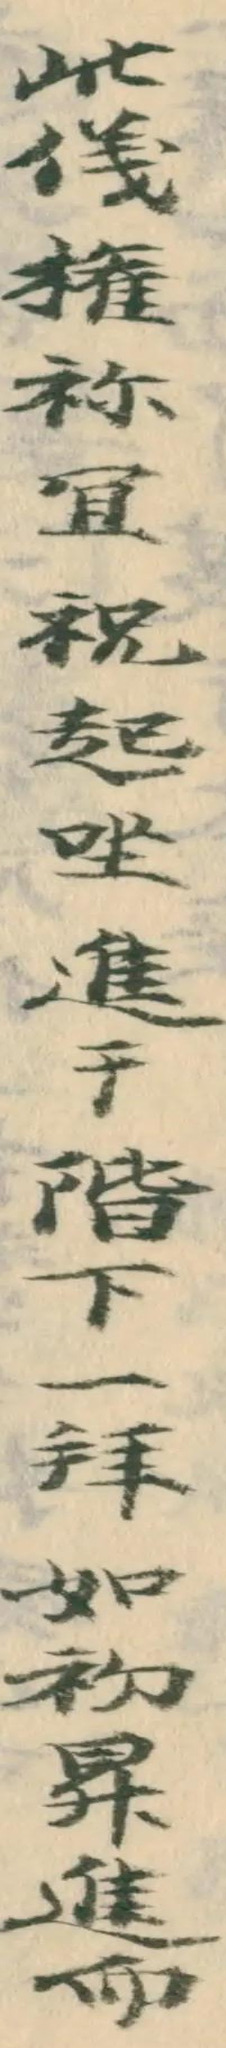此儀権禰宜祝起坐進于階下一拝如初昇進而
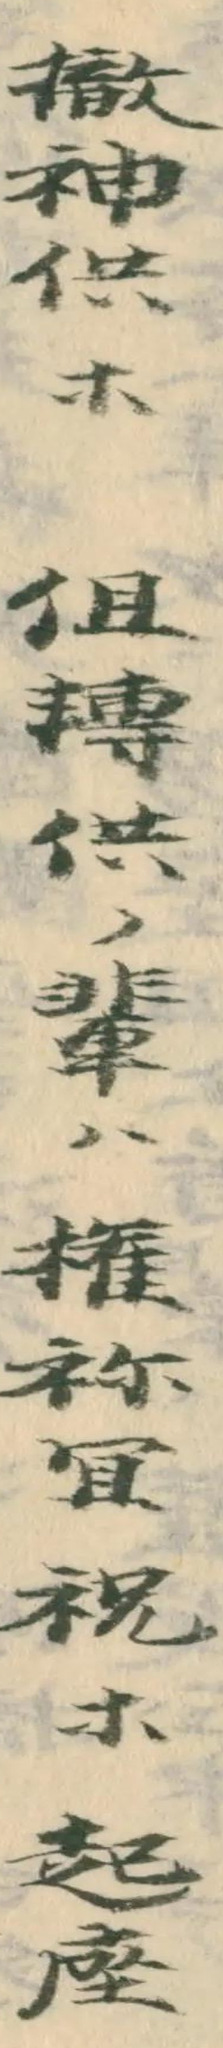撤神供等但転供ノ輩ハ権禰宜祝等起座
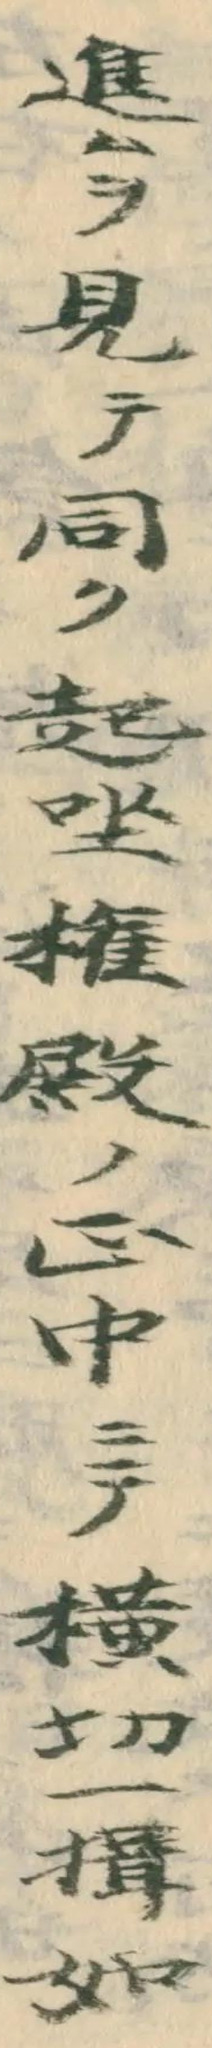進ムヲ見テ同ク起坐権殿ノ正中ニテ横切一揖如
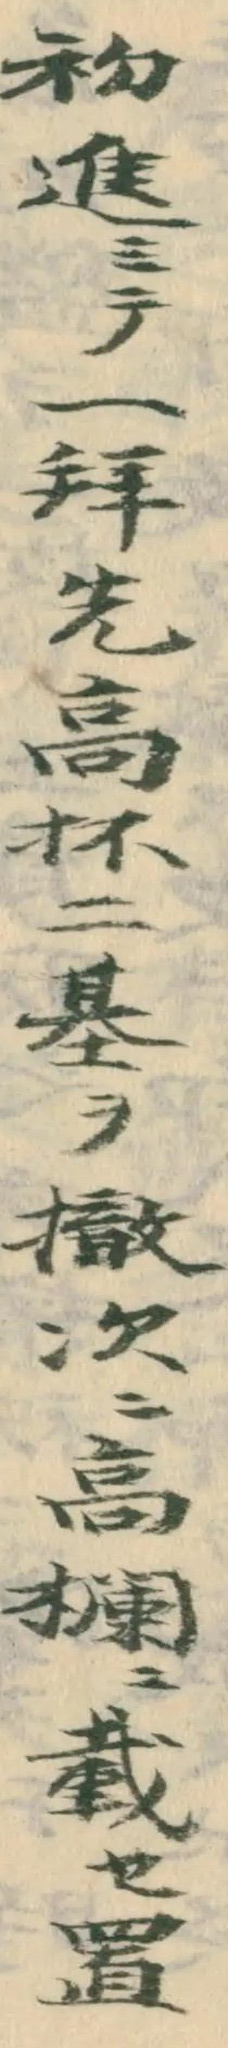初進ミテ一拝先高抔二基ヲ撤次ニ高欄ニ載セ置

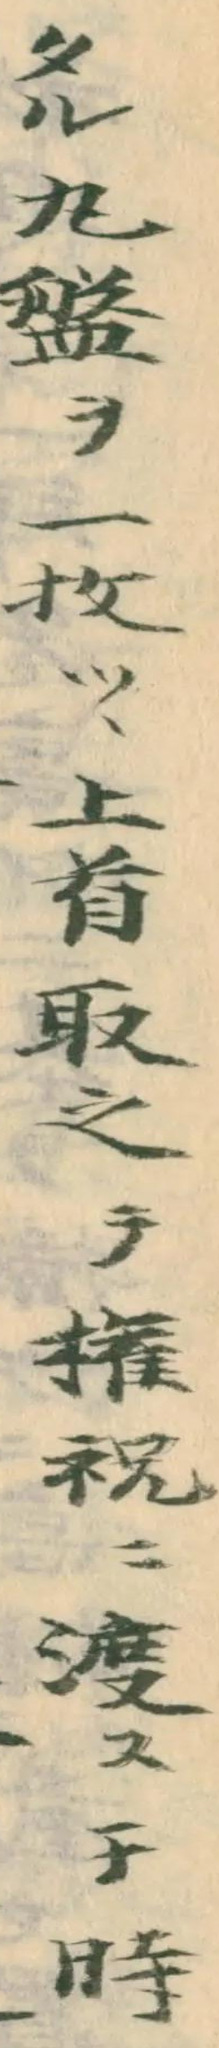タル丸盤ヲ一枚ツヽ上首取之テ権祝ニ渡ス于時
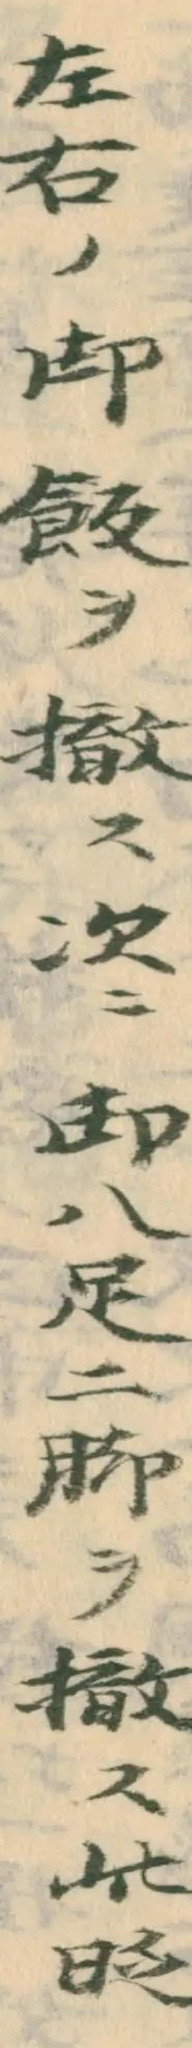左右ノ御飯ヲ撤ス次ニ御八足二脚ヲ撤ス此時
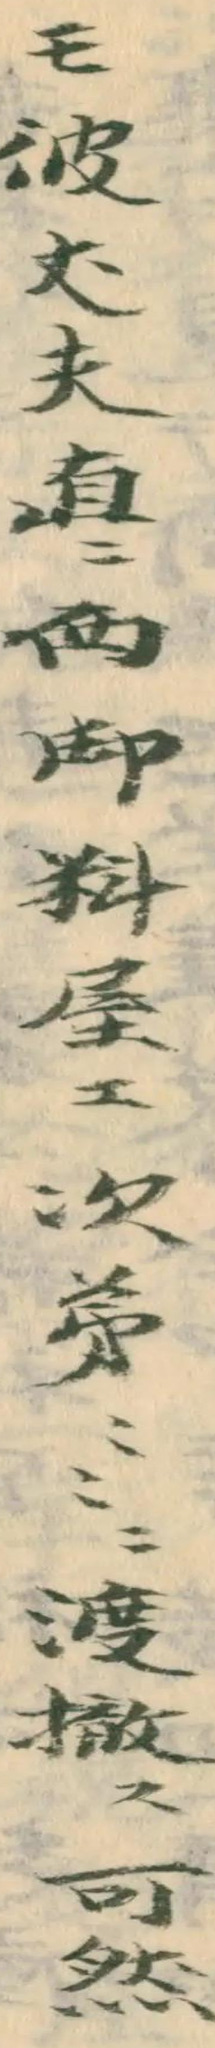モ彼丈夫直二西御料屋エ次第〳〵ニ渡撤ス可然
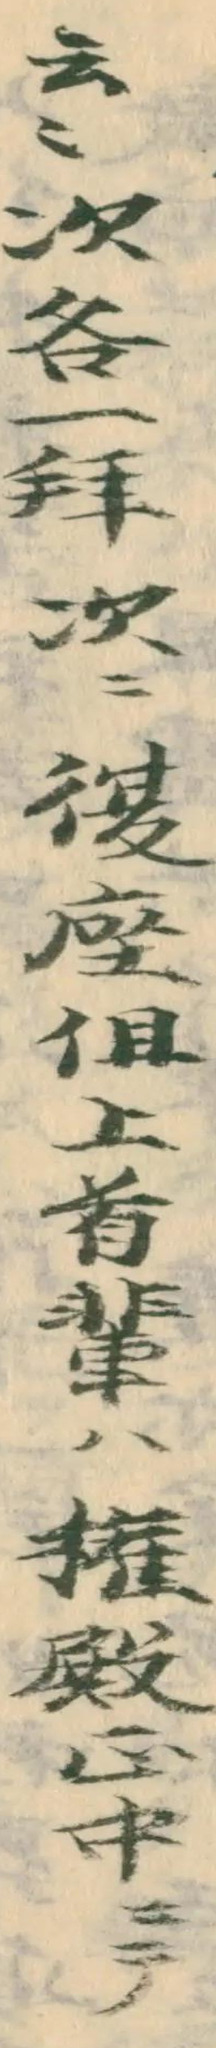云々次各一拝次ニ復座但上首輩ハ権殿正中ニテ
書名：賀茂社記録. 第5冊
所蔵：国立国会図書館 National Diet Library, JAPAN
